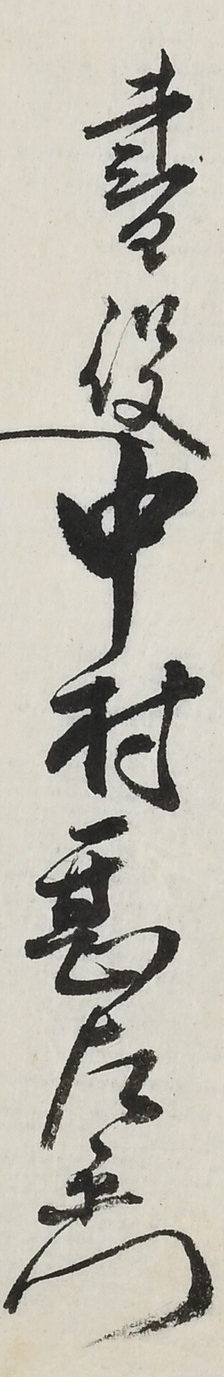書役中村甚左衛門
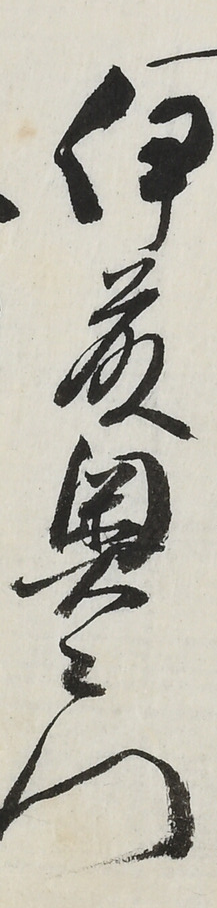伊藤奥右衛門
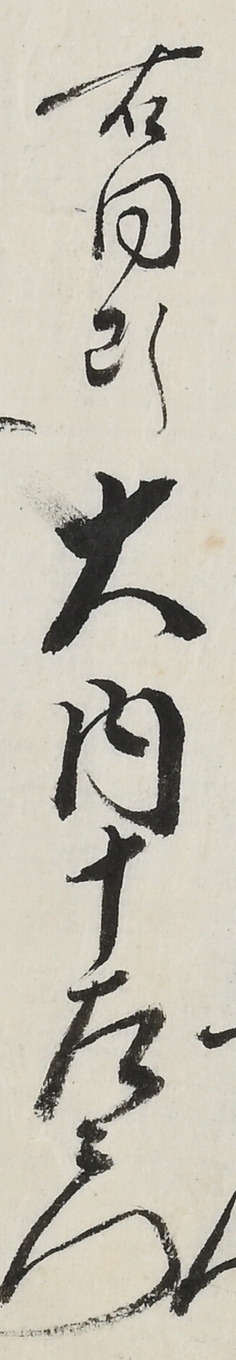右同断大内十左衛門
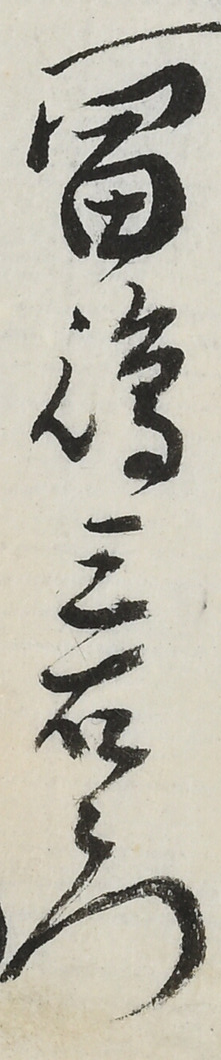冨嶋三右衛門
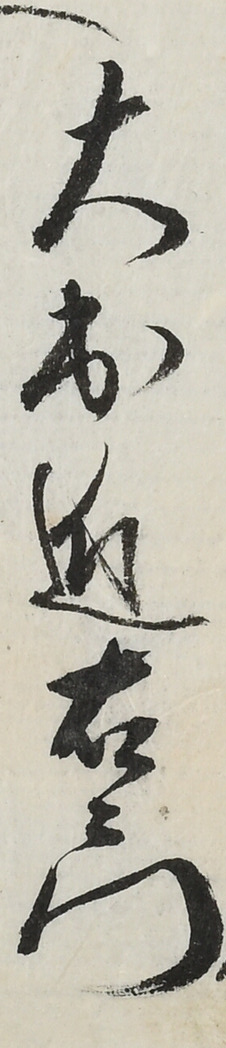賄大出近右衛門
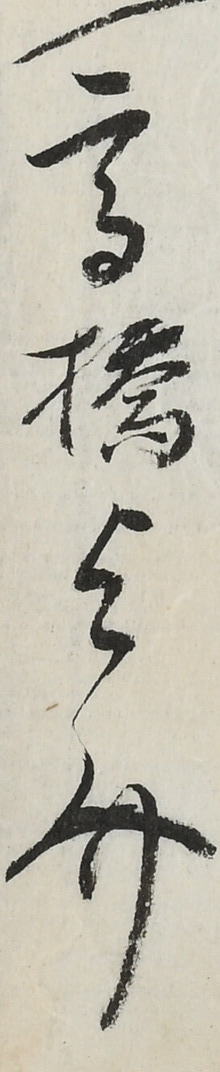高橋与介

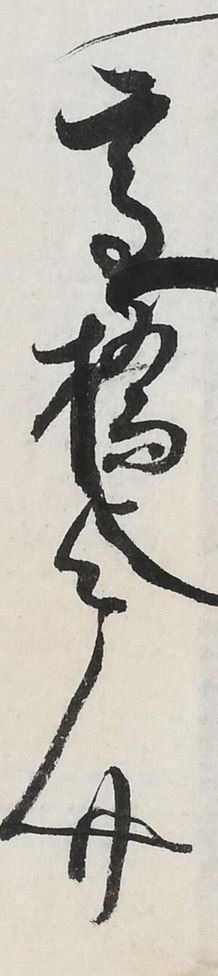高橋与介
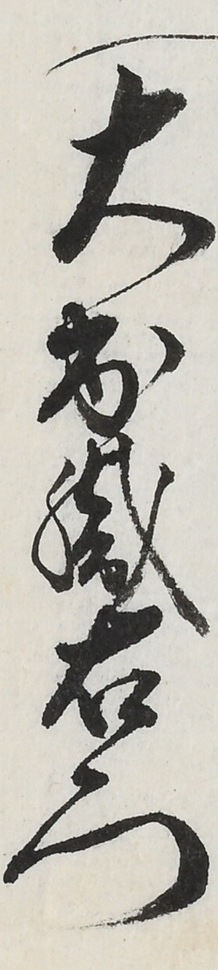大出掛右衛門
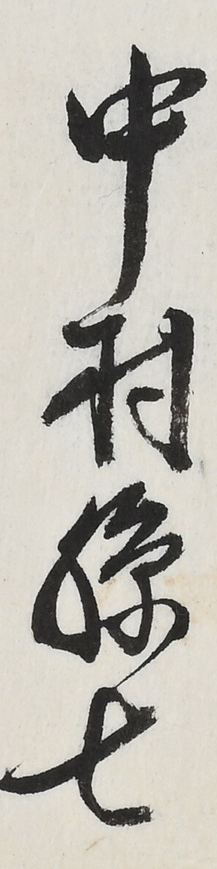中村孫七
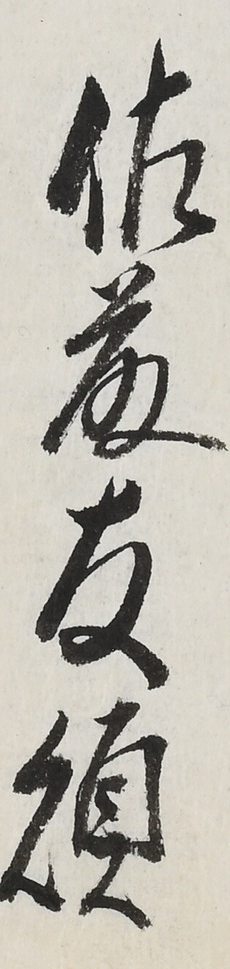佐藤友順
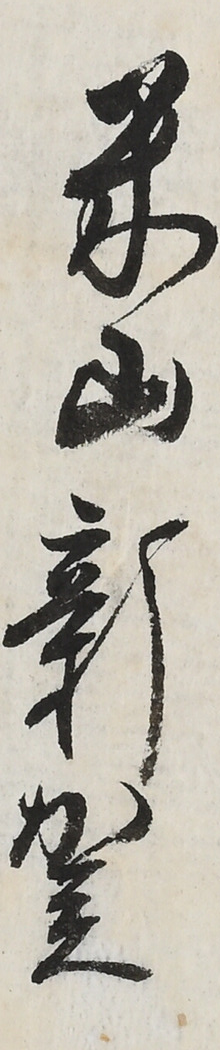米山新賀
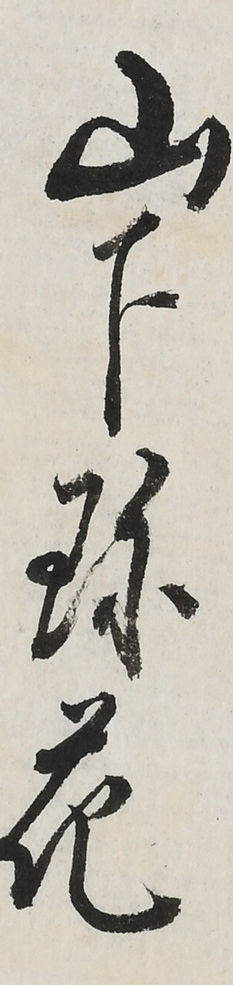山下珍花
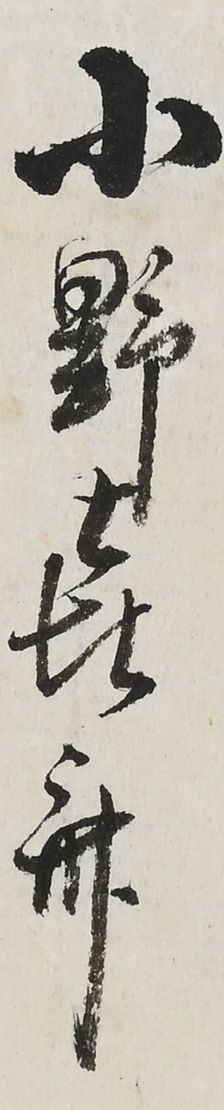小野喜斉

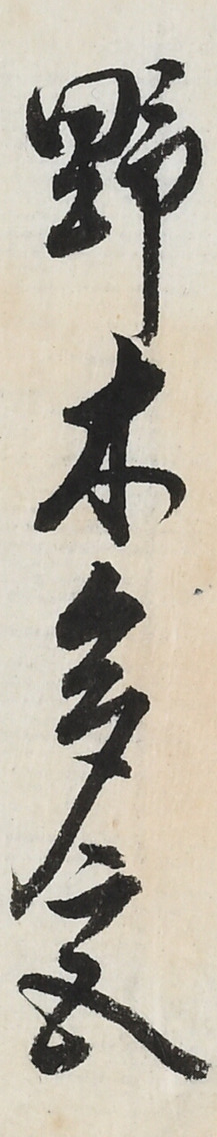野木多宮
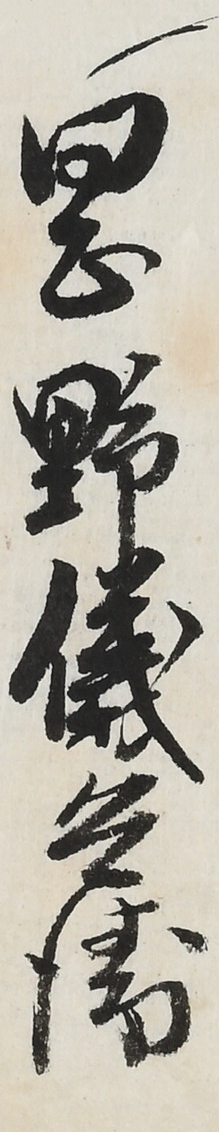岡野儀兵衛
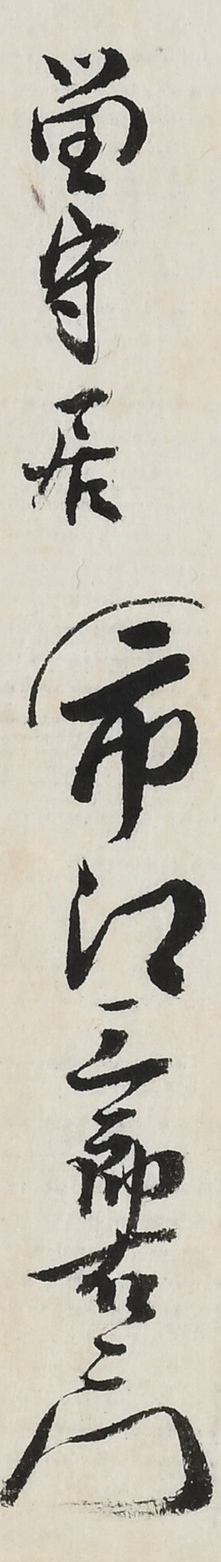留守居市江三郎右衛門
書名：高遠江戸徒以上之面々
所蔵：伊那市立高遠町図書館・合同会社AMANE
